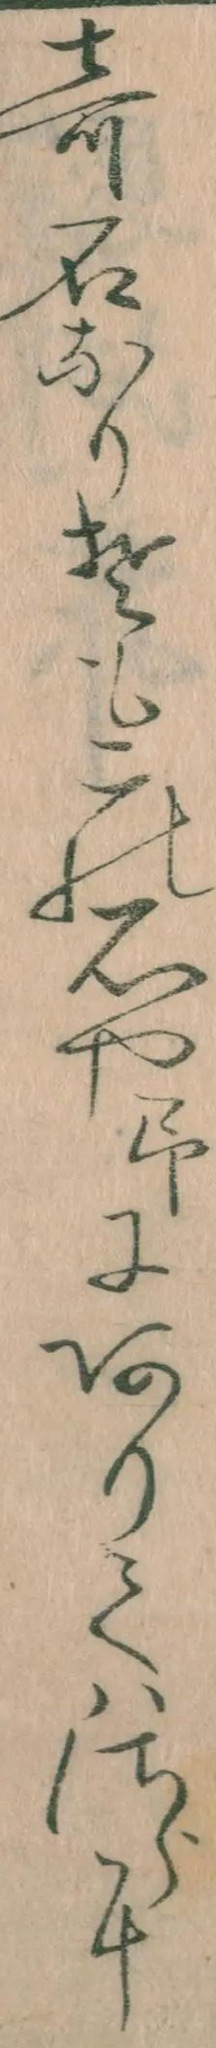奇石なりそもこの石や予にありてはさらに
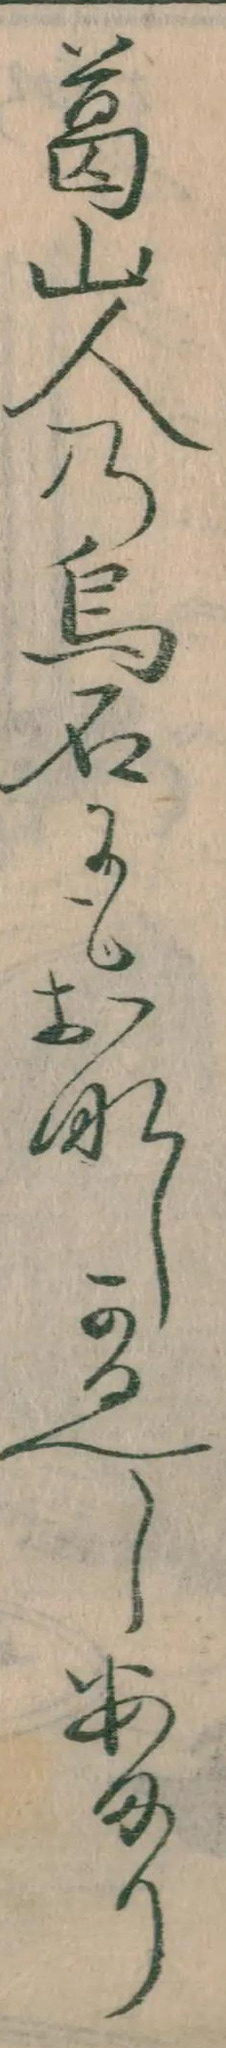葛山人の烏石にもおなしかるへしあまり
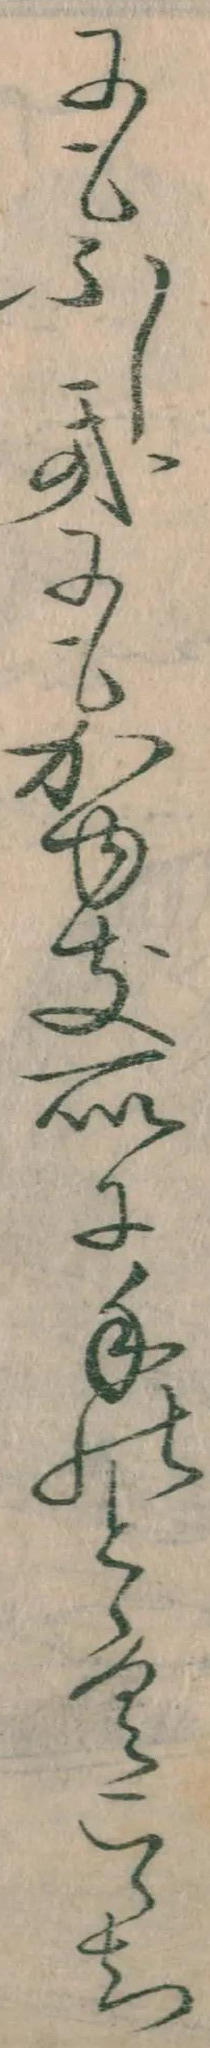にもふしきにもかゆき所に手のとゝくこゝち
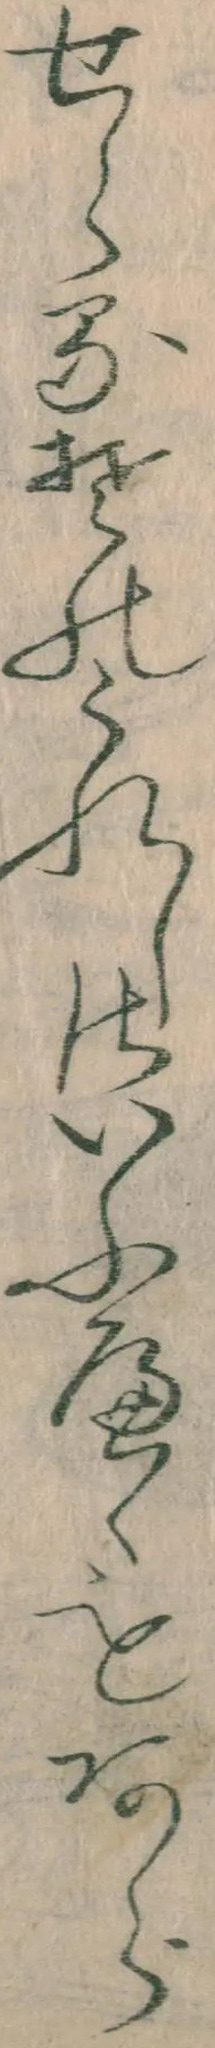せらるそのうれしさいふへくもあら
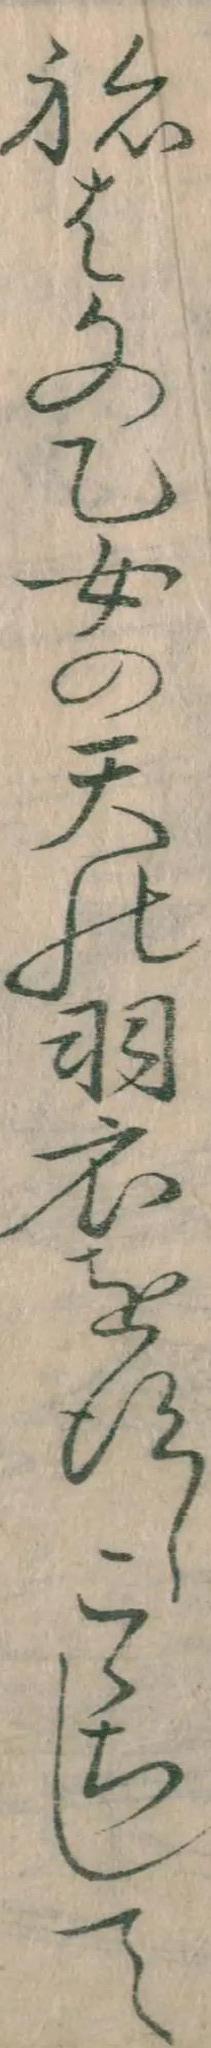ねはかの乙女の天の羽衣を得しこゝちして
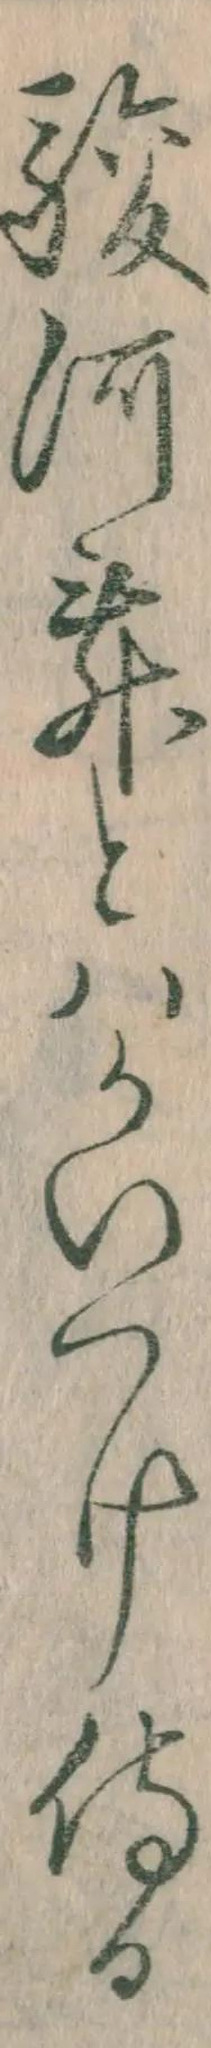駿河舞とはかいつけ侍る
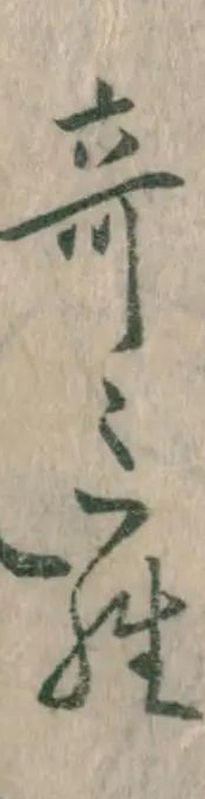奇々羅

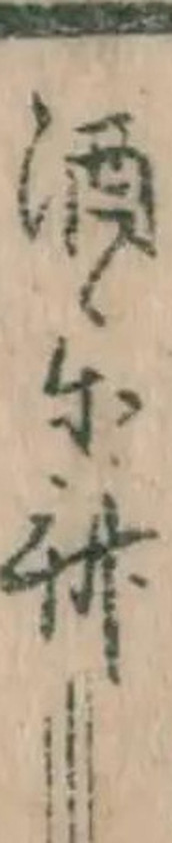酒楽斎

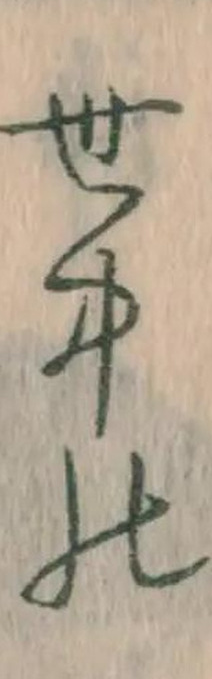世中の
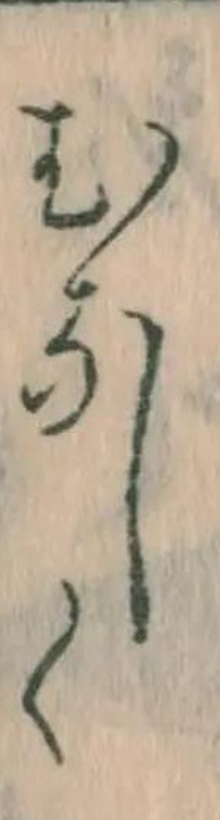むなしく
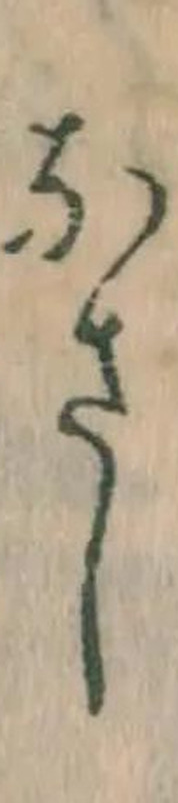なさし
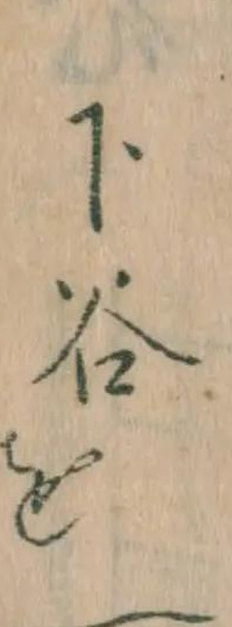下谷を
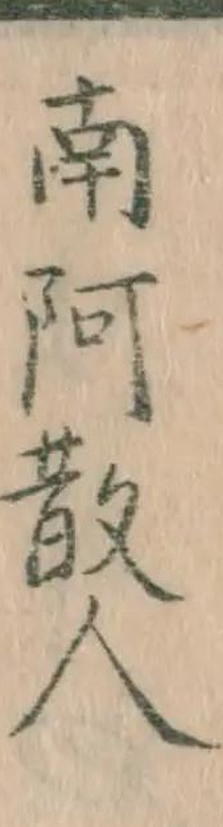南阿散人

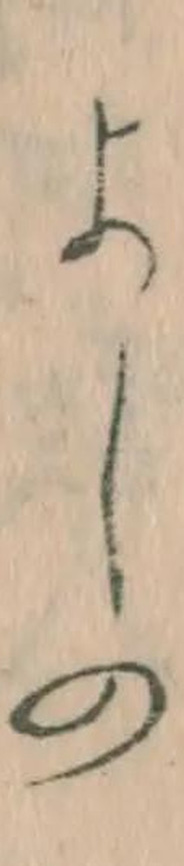よしの
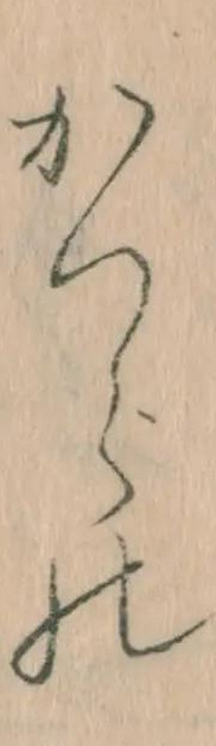かつらの
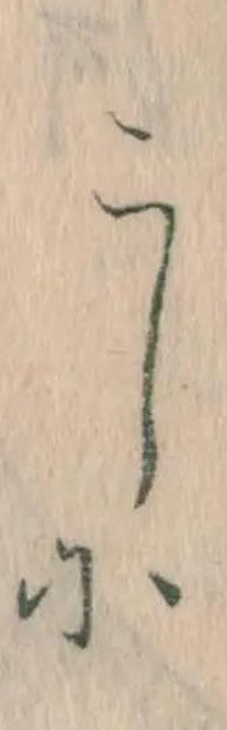こしに
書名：駿河舞 3巻
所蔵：国立国会図書館 National Diet Library, JAPAN
